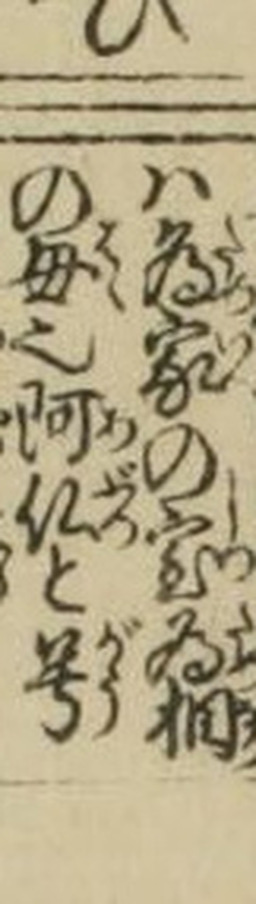の母也阿仏と号
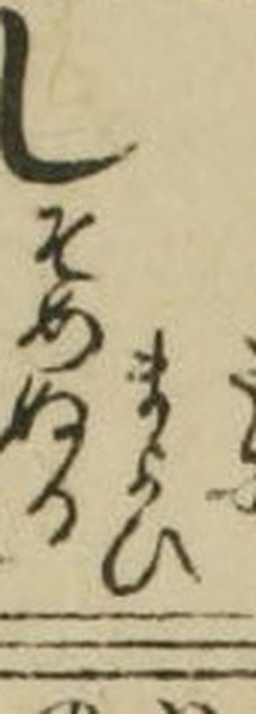そめぬる
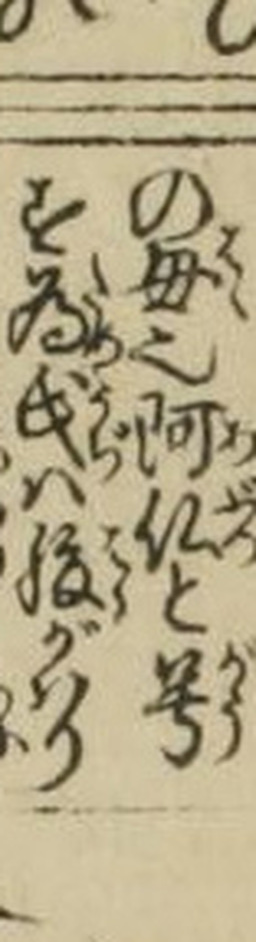す為氏は腹がはり
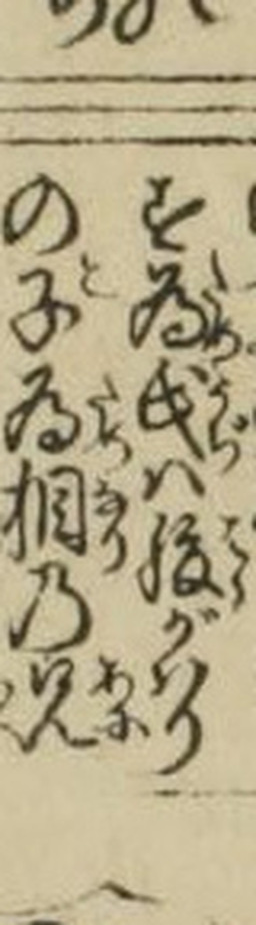の子為相の兄
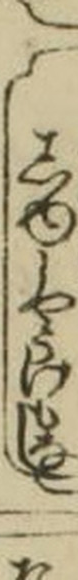しゆしやうけもなし
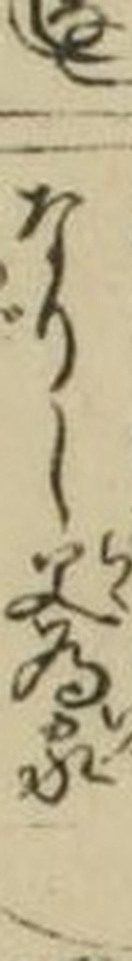なりし父為家
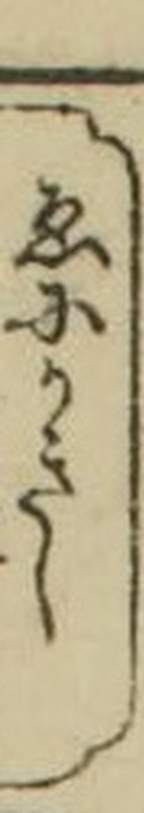ゑにかきし
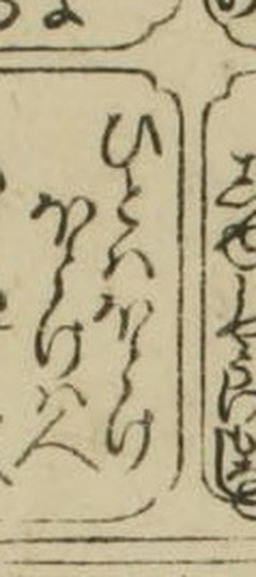ひとはほとけ
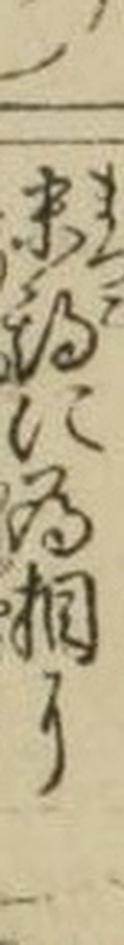末期に為相に
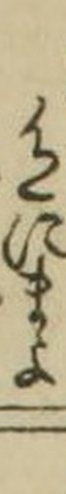道にまよ
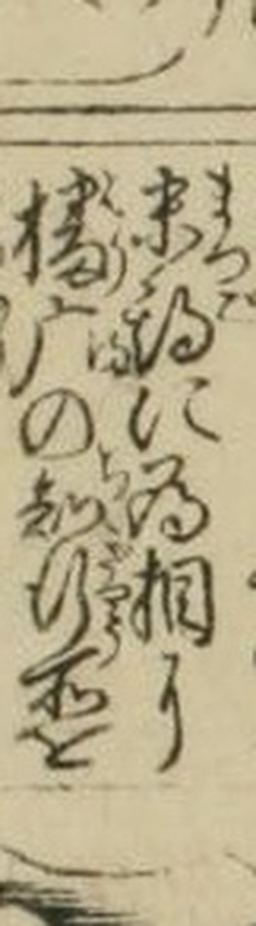播磨の知行所を
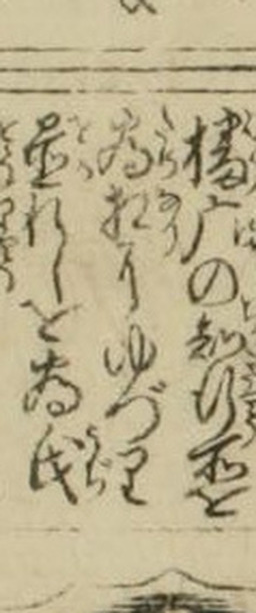為相にゆづり
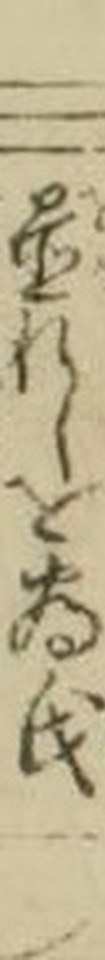置れしを為氏
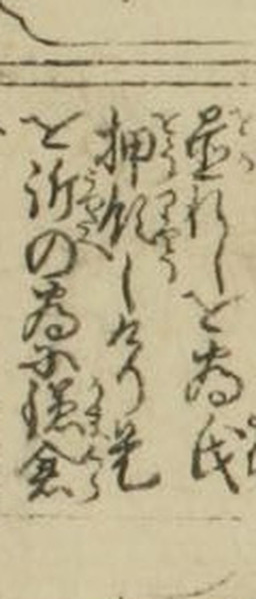押領しけり是
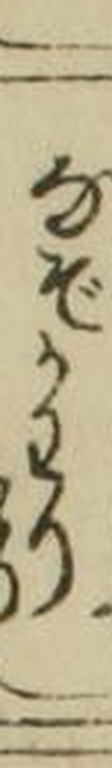なぞかわり
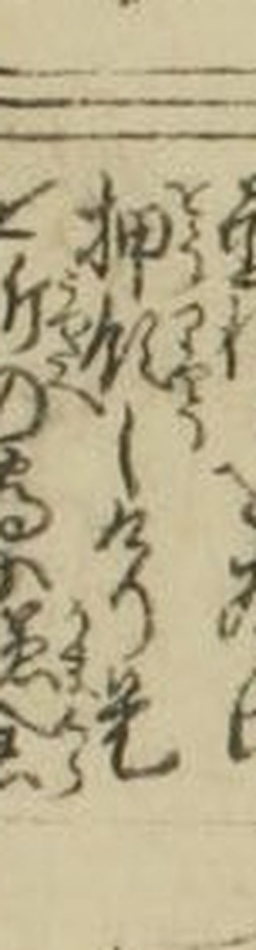を訴の為に鎌倉
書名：女源氏教訓鑑
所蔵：東京学芸大学附属図書館
